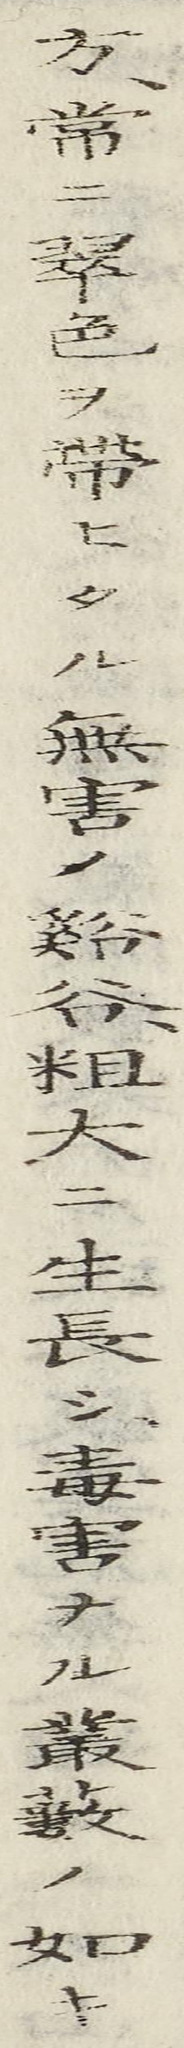方、常ニ翠色ヲ帯ヒタル無害ノ渓谷、粗大ニ生長シ、毒害ナル叢薮ノ如キ
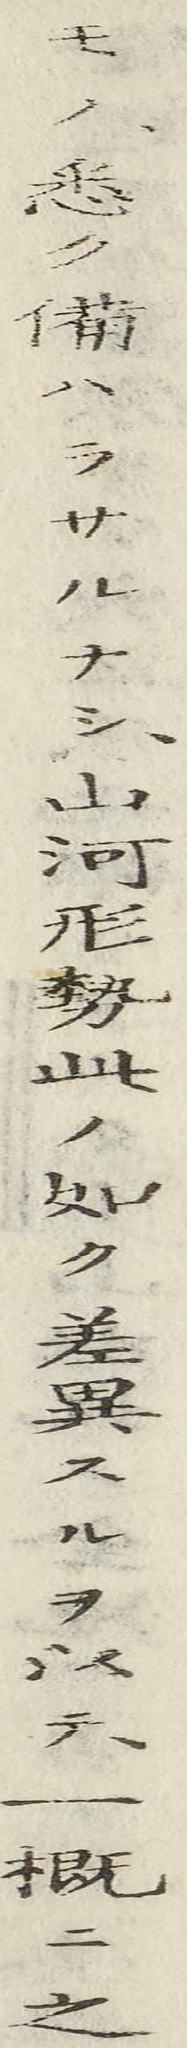モノ、悉ク備ハラサルナシ、山河形勢此ノ如ク差異スルヲ以テ、一概ニ之
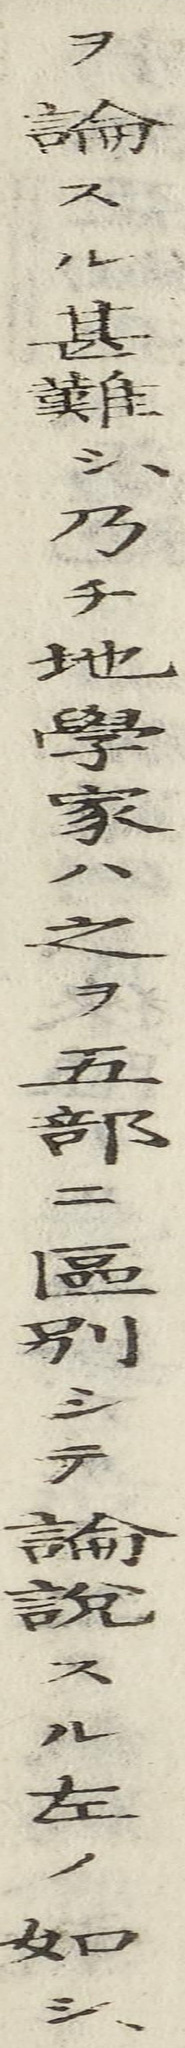ヲ論スル甚難シ、乃チ地学家ハ之ヲ五部ニ区別シテ論説スル左ノ如シ、

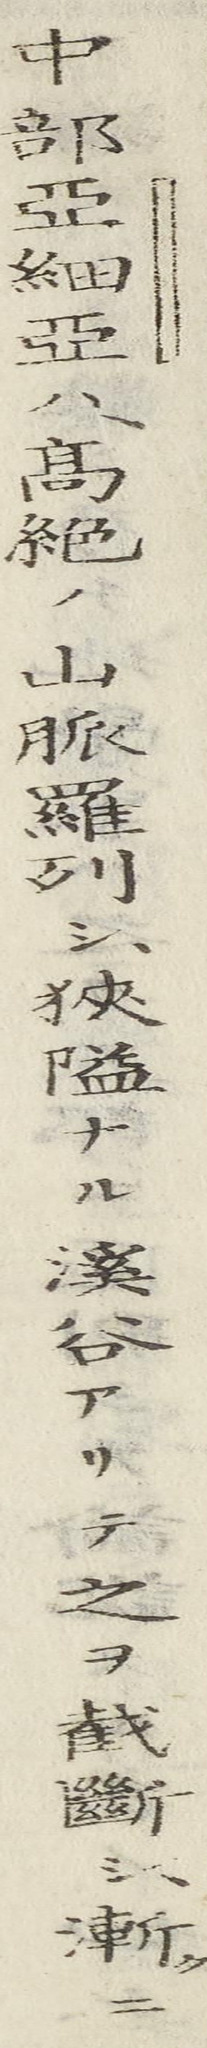中部亜細亜ハ、高絶ノ山脈羅列シ、狭隘ナル渓谷アリテ之ヲ截断シ、漸
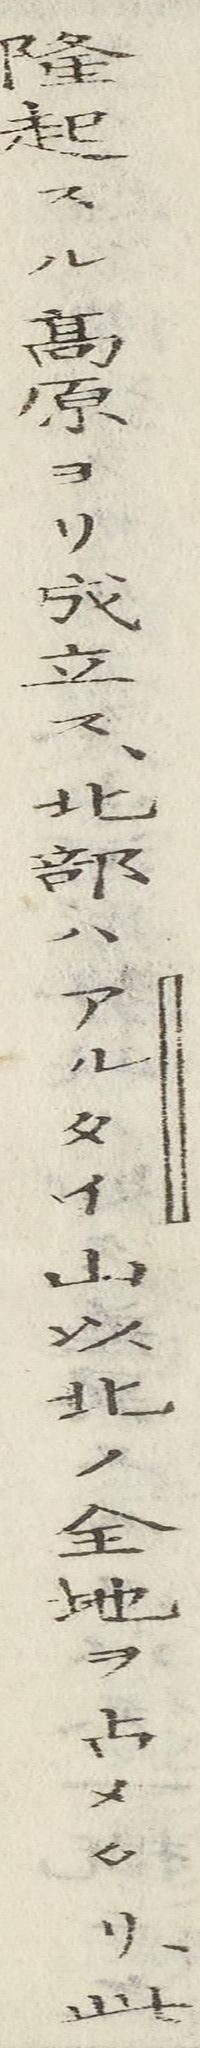隆起スル高原ヨリ成立ス、北部ハアルタイ山以北ノ全地ヲ占メタリ、此
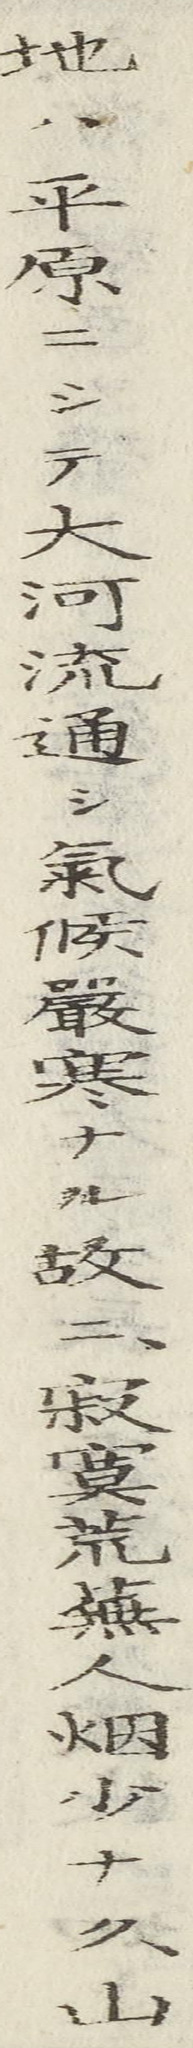地ハ平原ニシテ大河流通シ気候厳寒ナル故ニ、寂寞荒無人畑少ナク、山
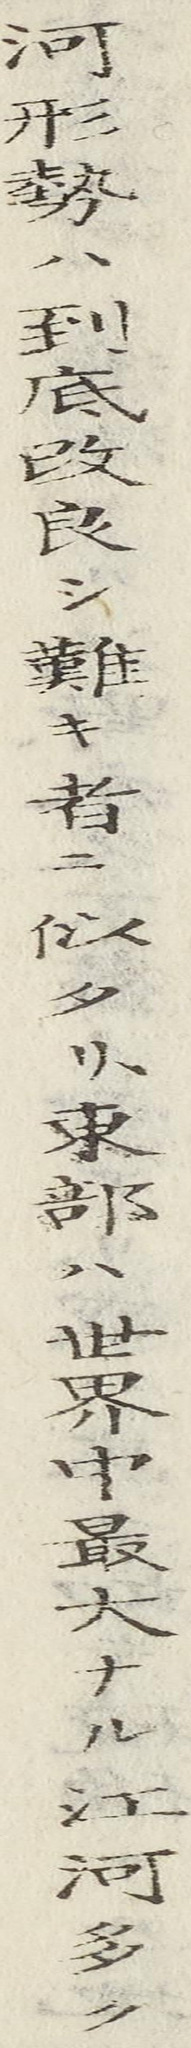河形勢ハ到底改良シ難キ者ニ似タリ、東部ハ世界中最大ナル江河多ク
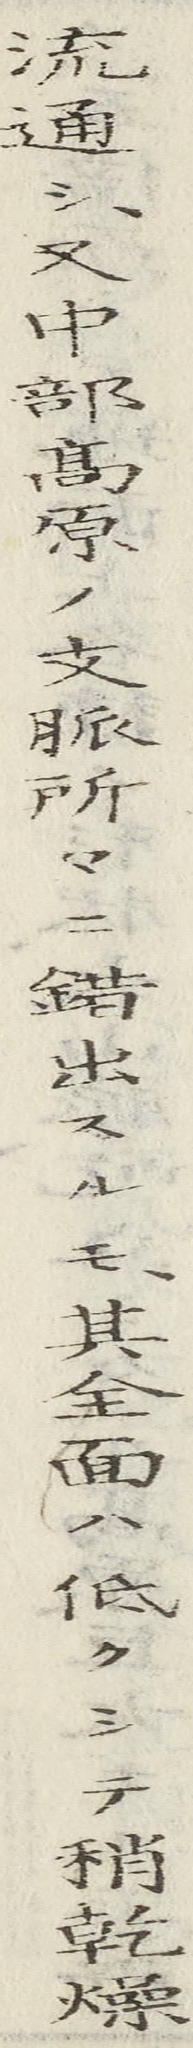流通シ、又中部高原ノ支脈所々ニ錯出スルモ、其全面ハ低クシテ稍乾燥
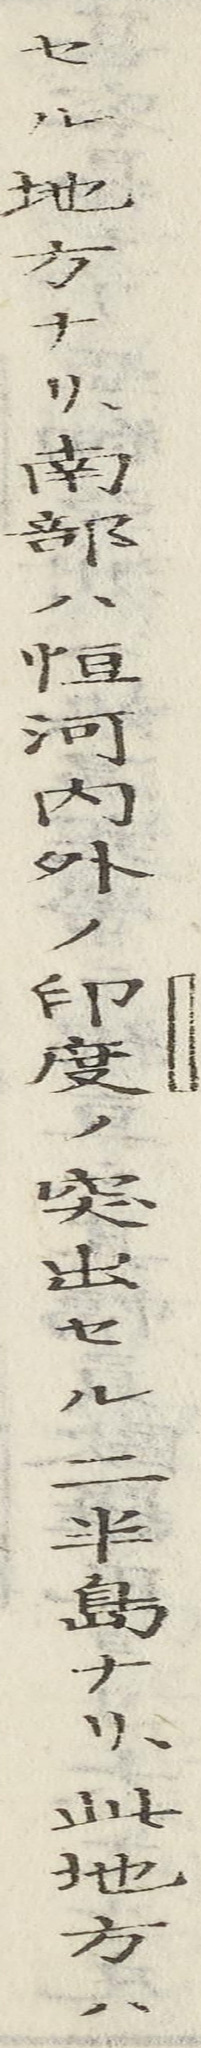セル地方ナリ、南部ハ恒河内外ノ印度ノ突出セルニ半島ナリ、此地方ハ
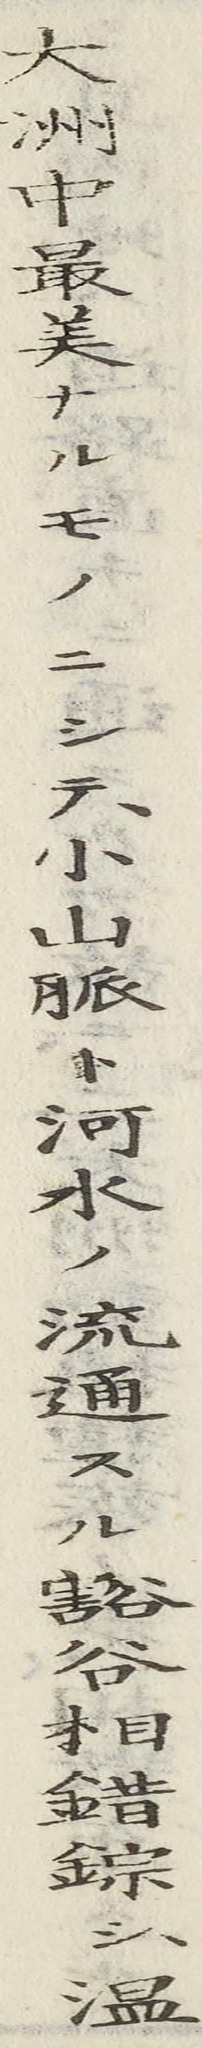大洲中最美ナルモノニシテ、小山脈ト河水ノ流通スル豁谷相錯綜シ、温
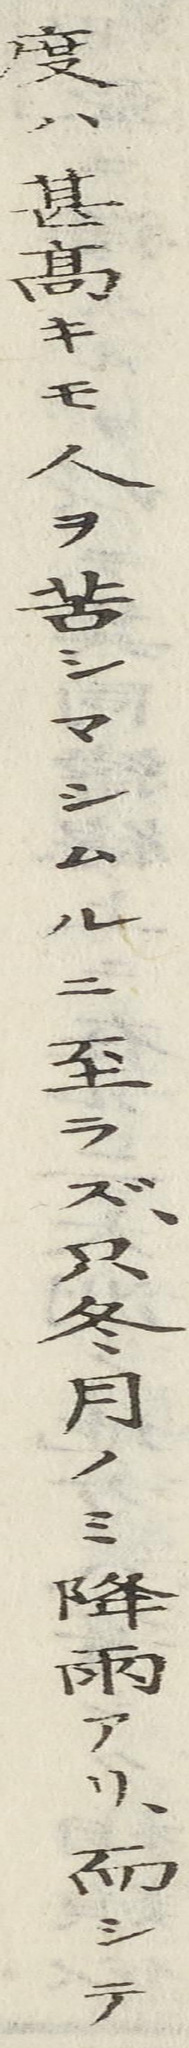度ハ甚高キモ人ヲ苦シマシムルニ至ラズ、只冬月ノミ降雨アリ、而シテ
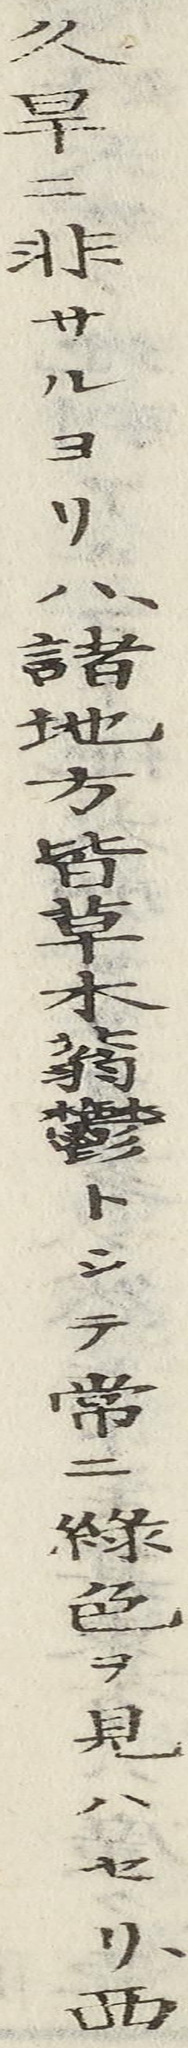久旱ニ非サルヨリハ、諸地方皆草木蓊鬱トシテ常ニ緑色ヲ見ハセリ、西
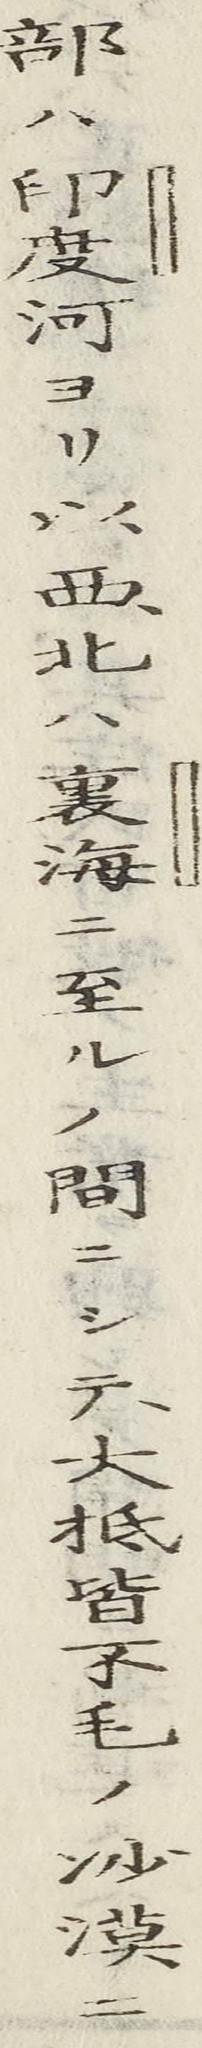部ハ印度河ヨリ以西、北ハ裏海ニ至ルノ間ニシテ、大抵皆不毛ノ沙漠ニ
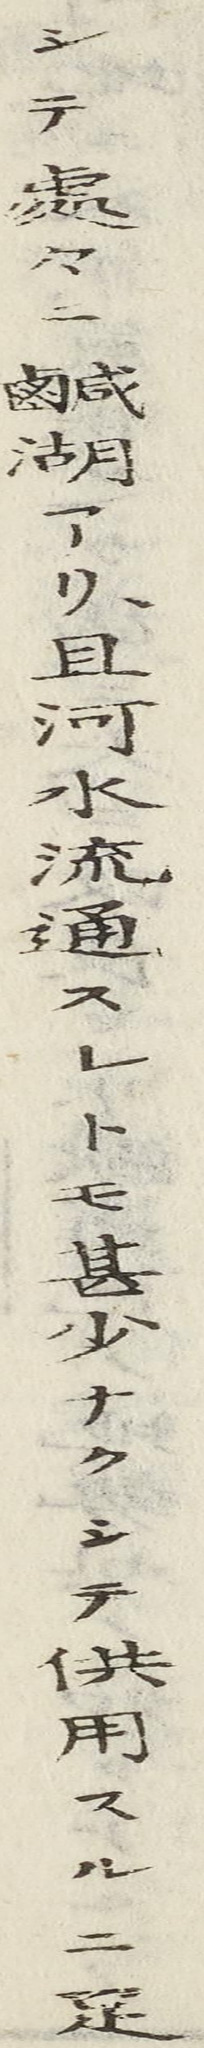シテ処々ニ鹹湖アリ、且河水流通スレトモ甚少ナクシテ供用スルニ足
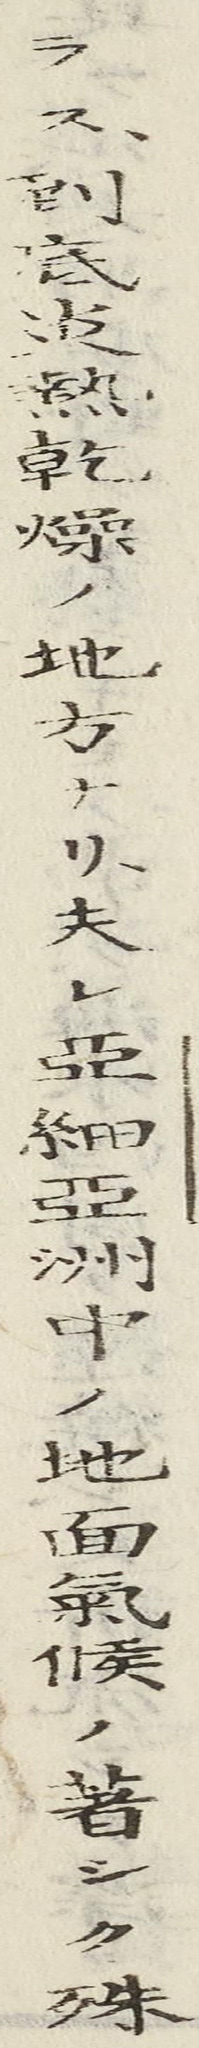ラス、到底炎熱乾燥ノ地方ナリ、夫レ亜細亜洲中ノ地面気候ノ著シク殊
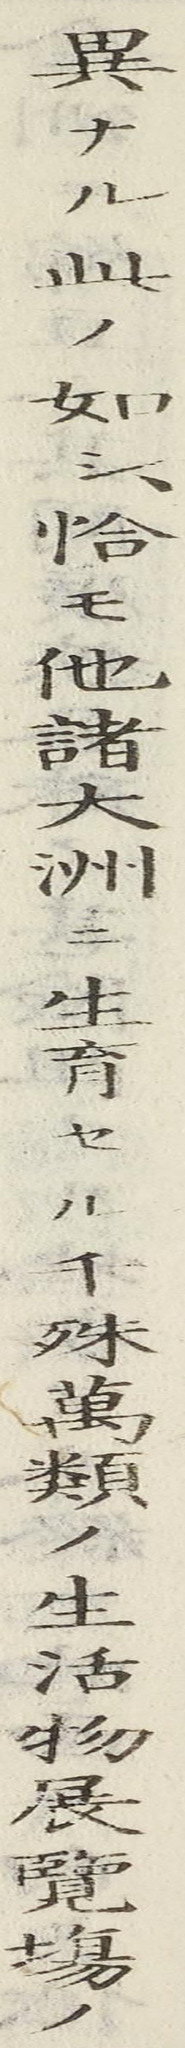異ナル此ノ如シ、恰モ他諸大洲ニ生育セル千殊万類ノ生活物展覧場ノ
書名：百科全書　地文學　全
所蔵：東京大学地震研究所図書室 Earthquake Research Institute Library, The University of Tokyo, JAPAN
